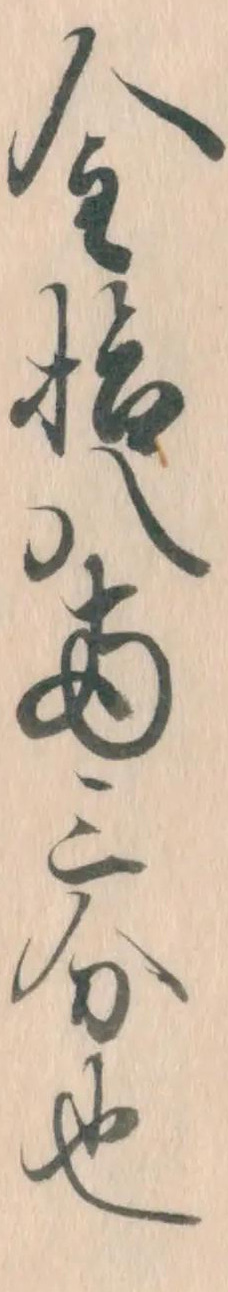金拾八両三分也
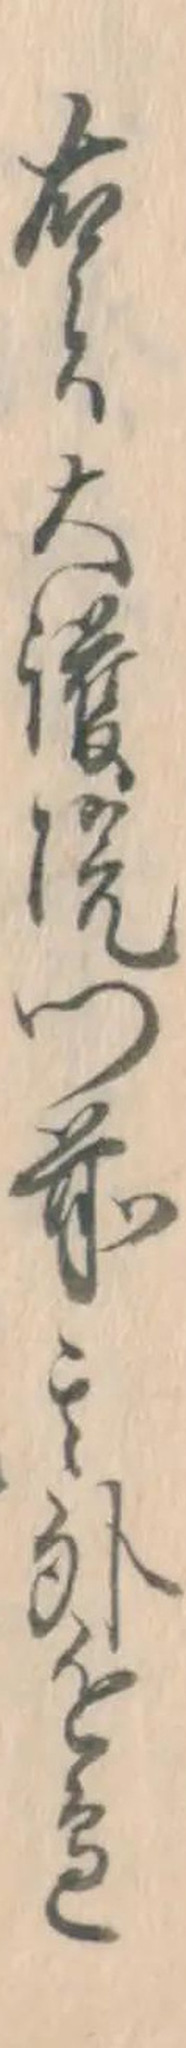右は大護院門前其外近辺
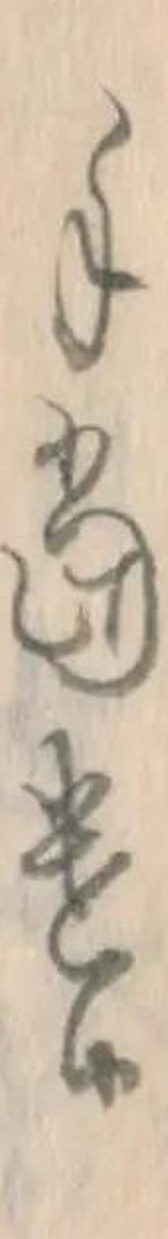手当遣候

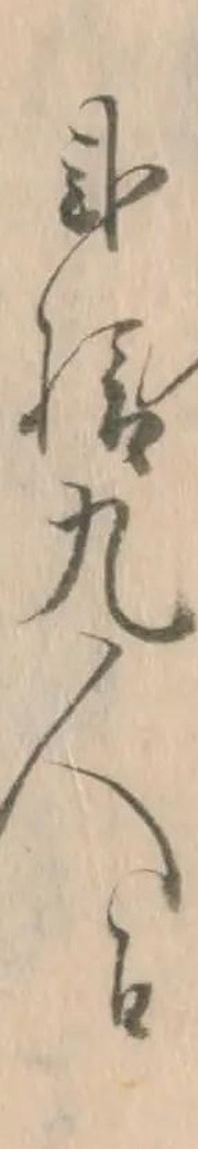弐拾九人え
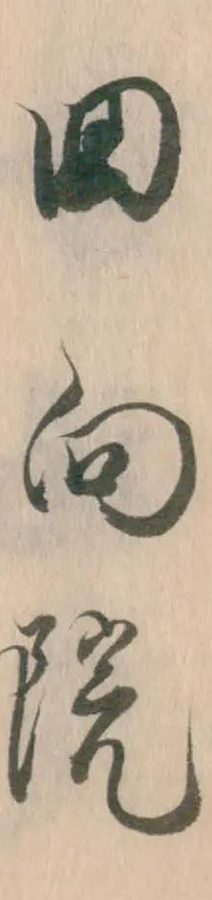回向院
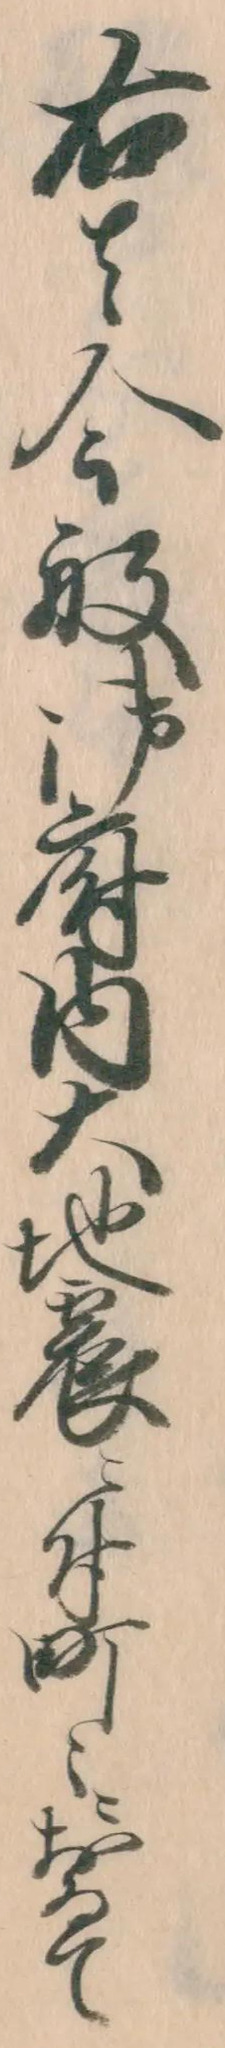右は今般御府内大地震ニ付町々ニおゐて
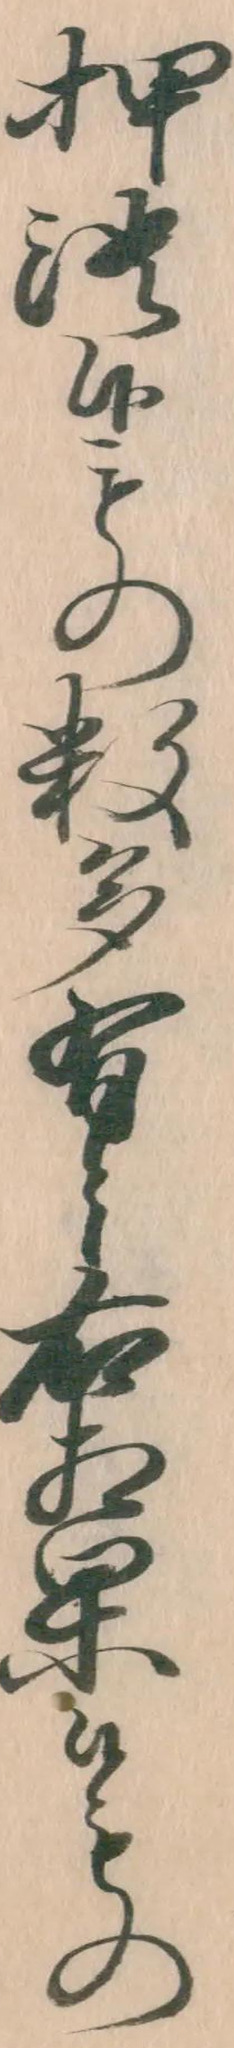押潰候もの数多有之右相果候もの
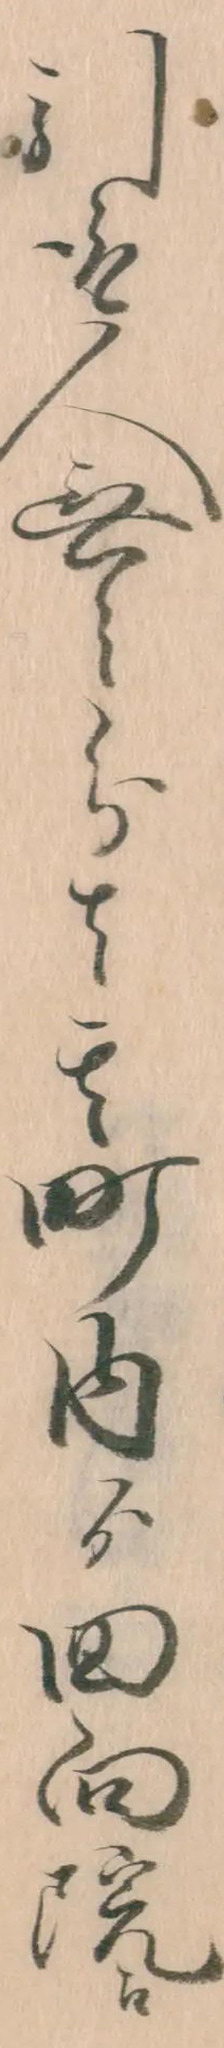引取人無之分は其町内ゟ回向院え
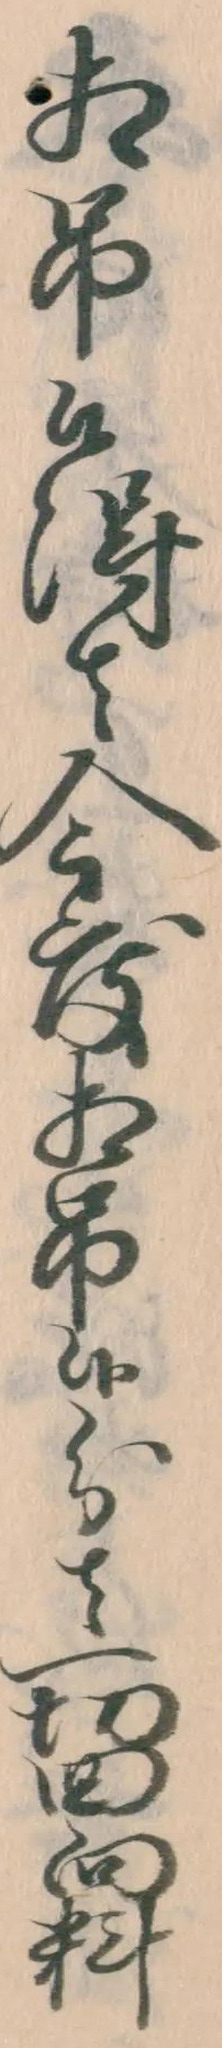相弔候得は今度相弔候分は一切回向料
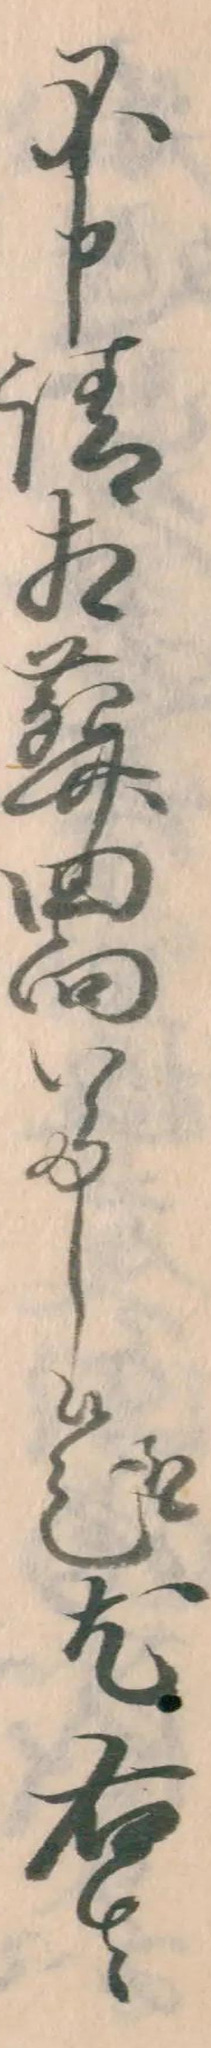不申請相葬回向いたし候趣尤右は
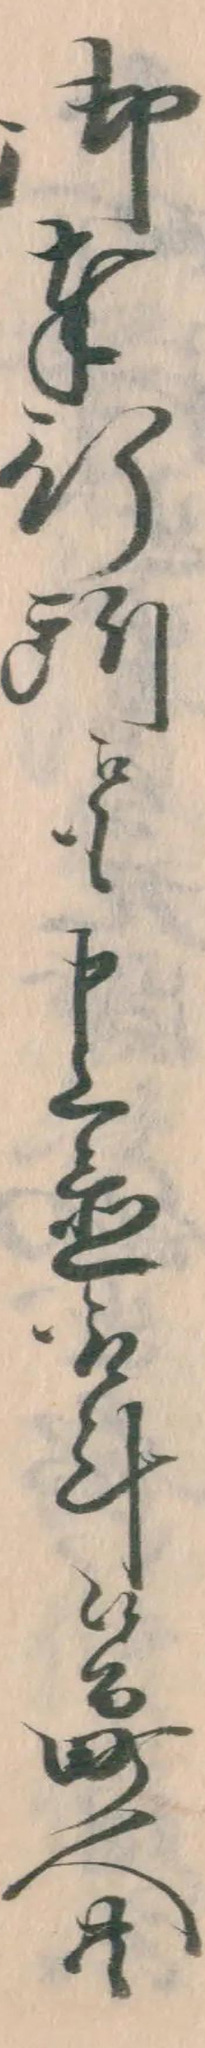御奉行所えも申上置取計候而町人共
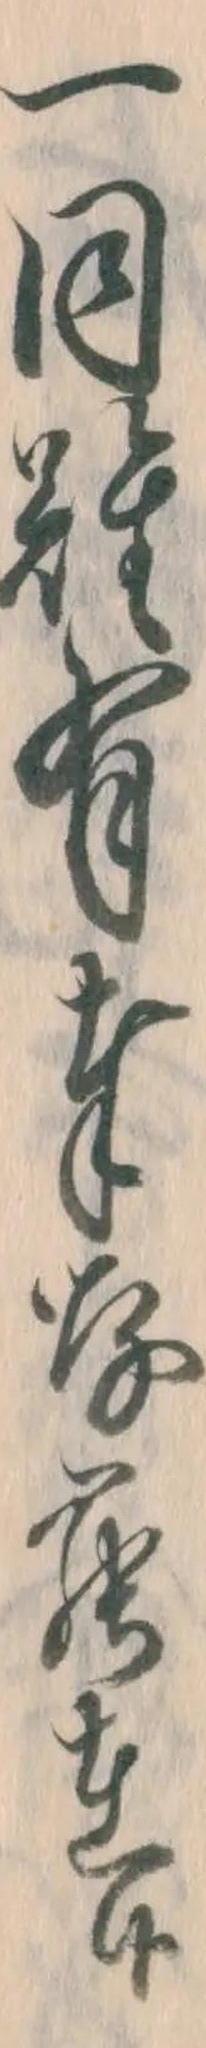一同難有奉存罷在候
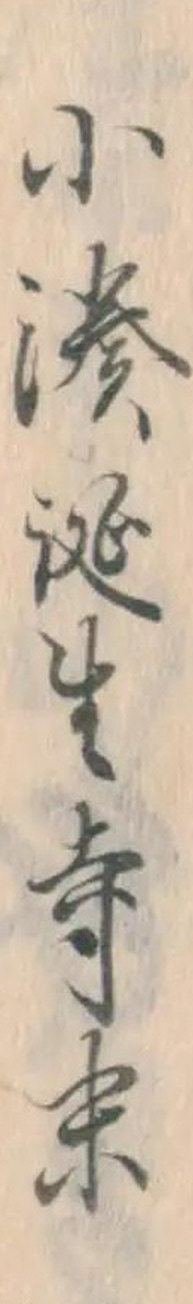小湊誕生寺末

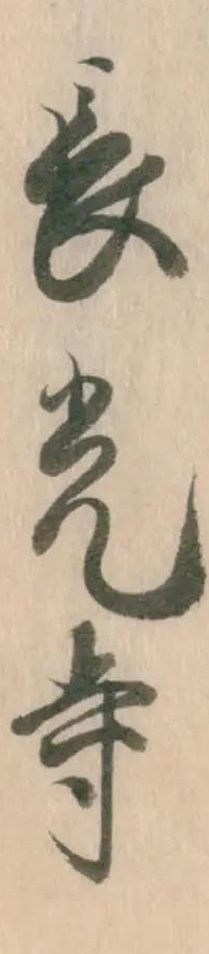長光寺
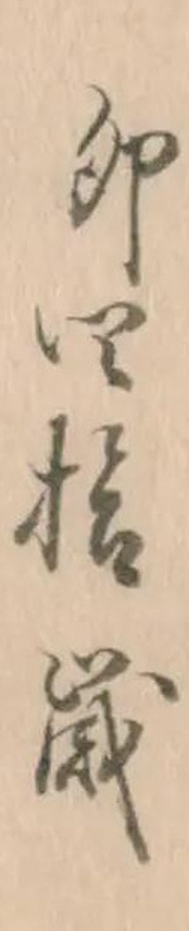卯四拾歳
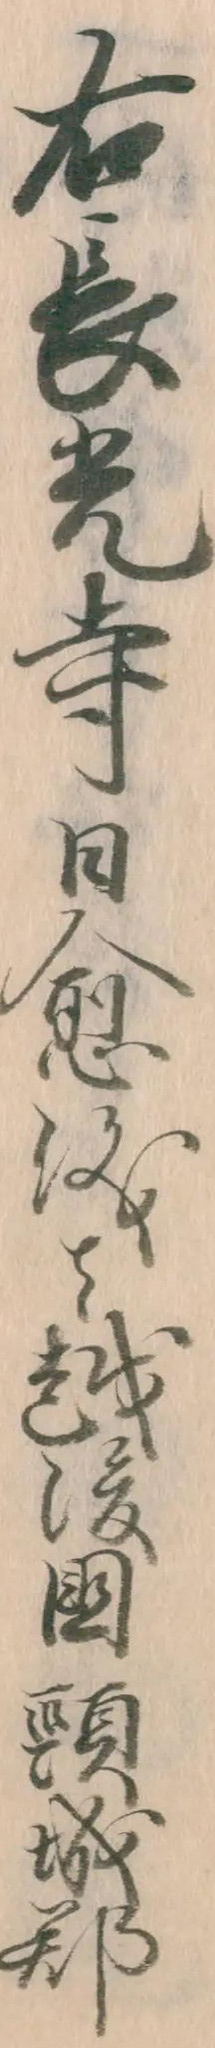右長光寺日愈儀は越後国頸城郡
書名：武家方并寺院等ニテ施差出候一件
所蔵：国立国会図書館 National Diet Library, JAPAN
